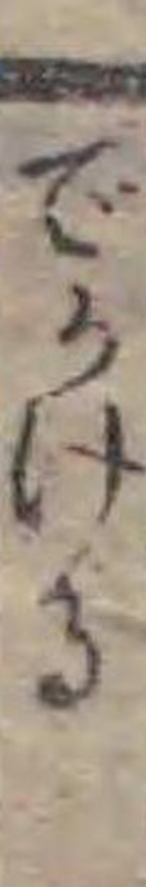でかける
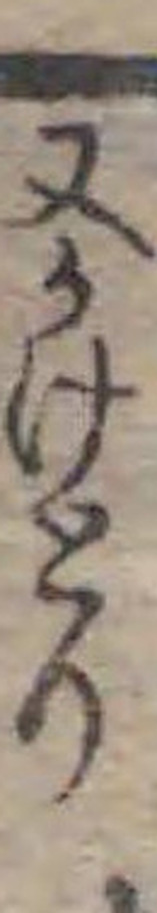又かけとり
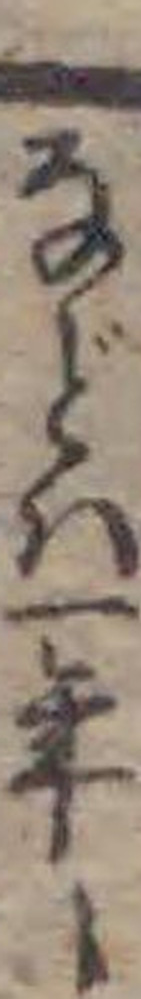などは一年
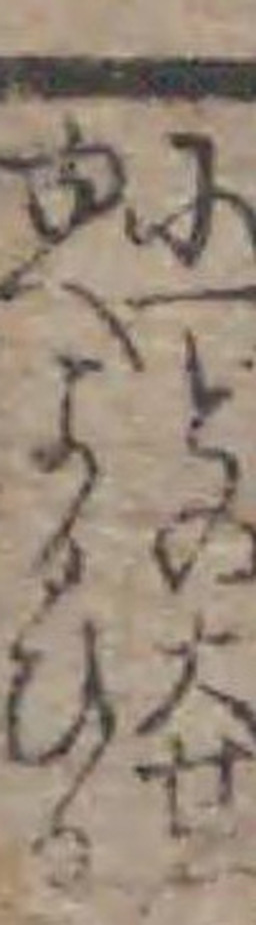ゆへよるひるの
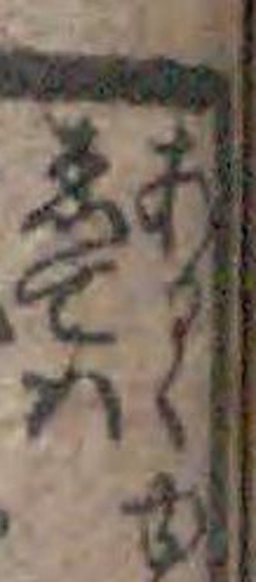ゑては
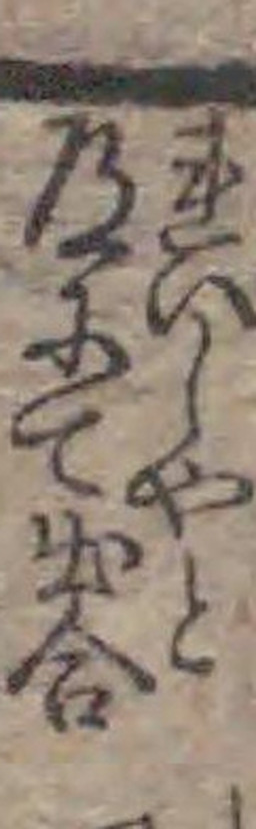道にて出合
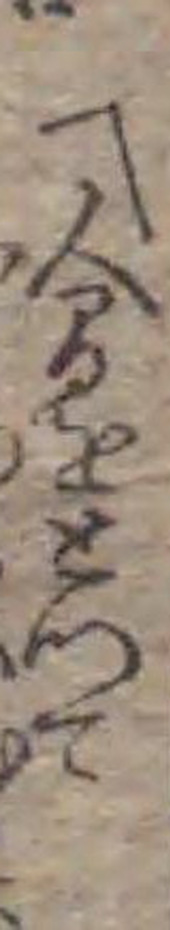〽人間をとつて
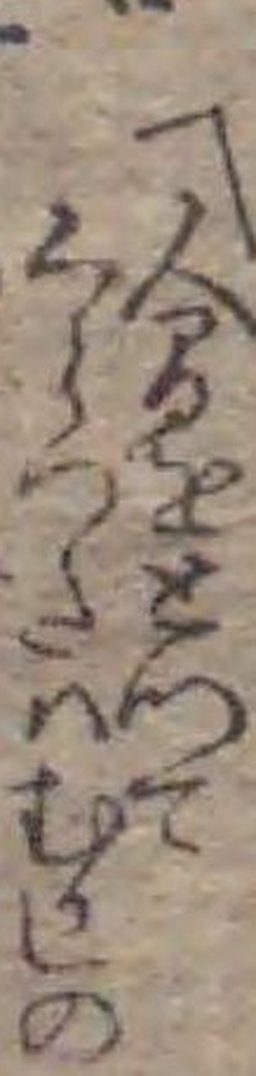くらつたはむかしの
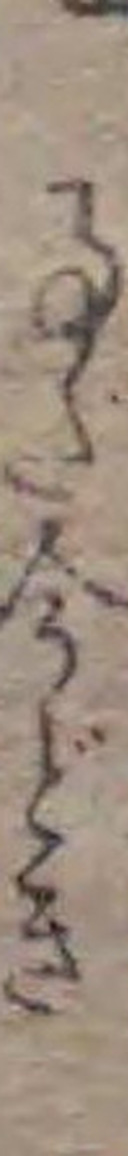事だ今どき
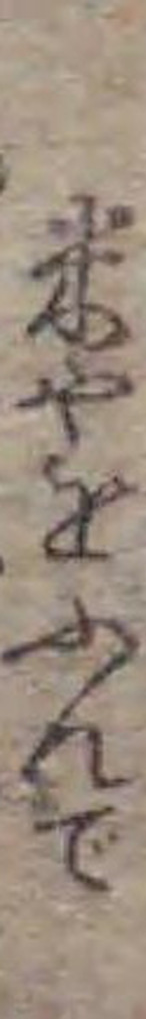米やをふんで
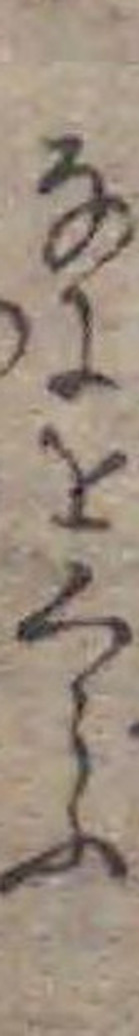なにをくらふ
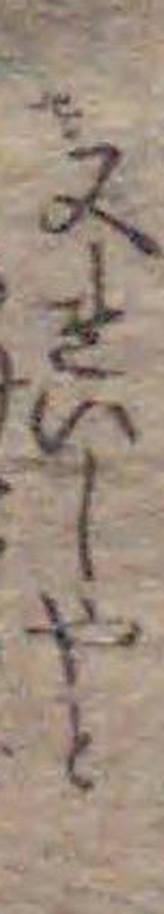れいしやと
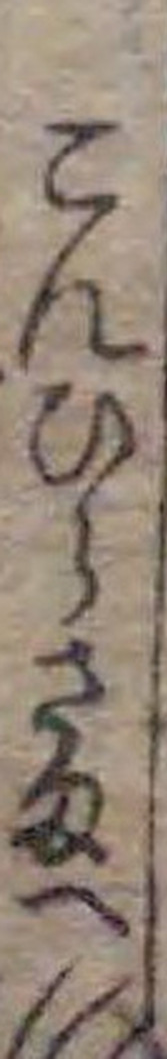こんひらさまへ
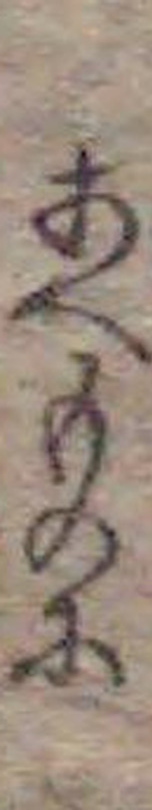あへものに
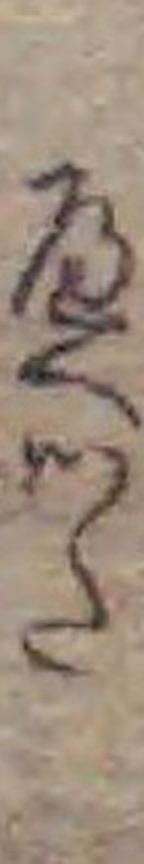へへつた
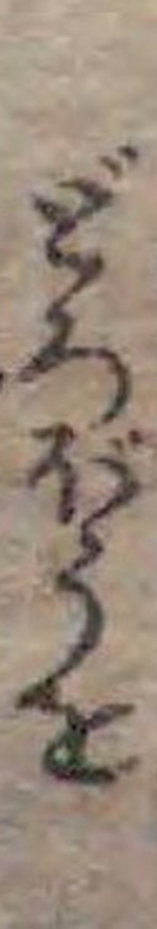どろぼうを
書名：年中行状記 : 2巻
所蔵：国立国会図書館 National Diet Library, JAPAN
